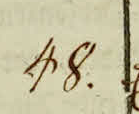48.
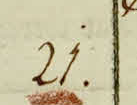21.
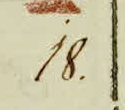18.
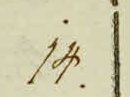14.
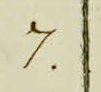7.
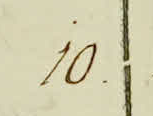10.
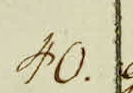40.
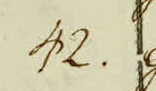42.
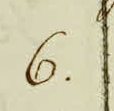6.
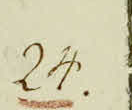24.
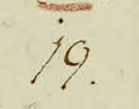9.
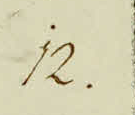12.
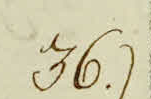36.
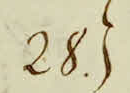28.
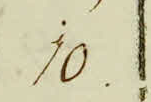10.
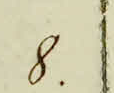8.
